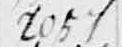2057
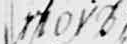11013
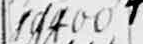19400
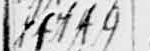11749
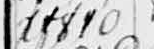25810
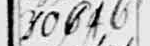30646
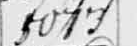5073
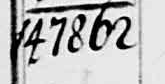147862
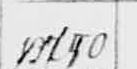13250
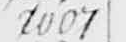2007
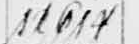12614
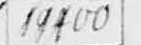19400
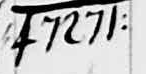47271
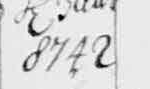8742
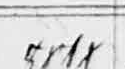5111
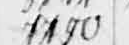1490
